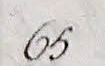65
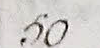50
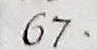67
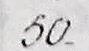50
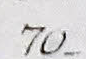70
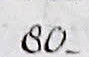80
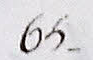65
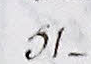51
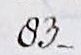83
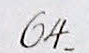64
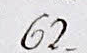62
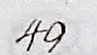49
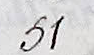51
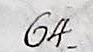64
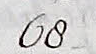68
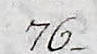76
